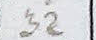32
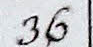36
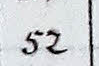52
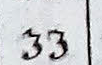33
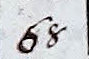68
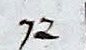72
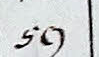59
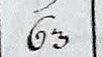63
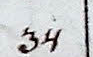34
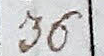36
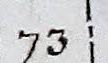73
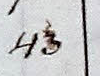43
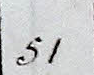51
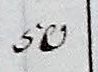50
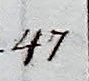47
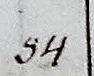54
